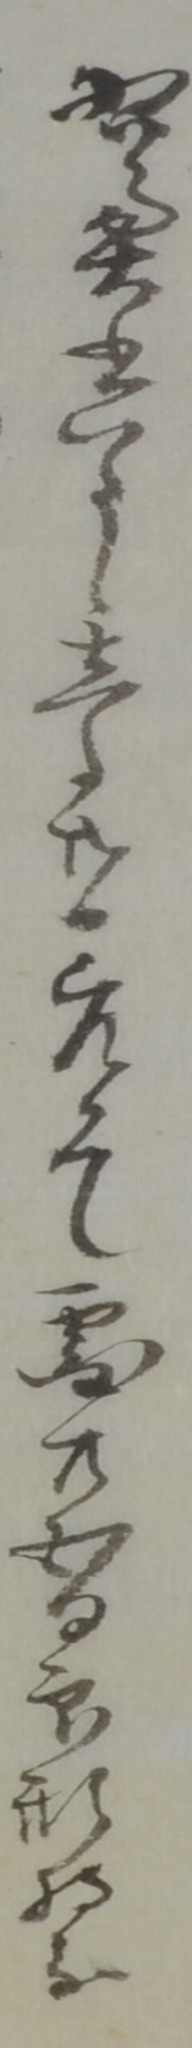右奥書いたし十二月廿日差上候處廿五日印形持参
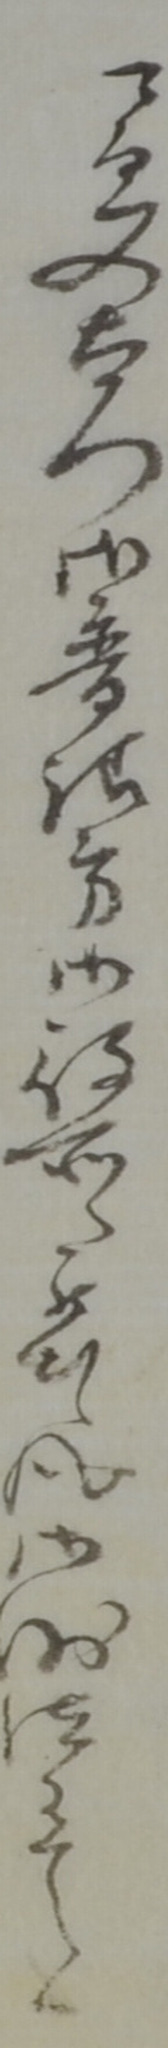ニ而又右衛門御普請方御役所へ罷出候様御沙汰有之候
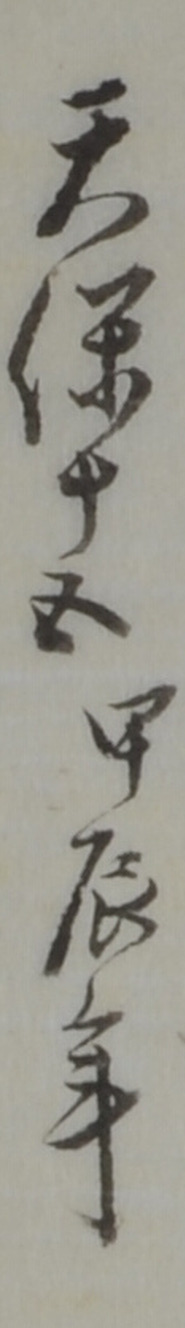天保十五甲辰年
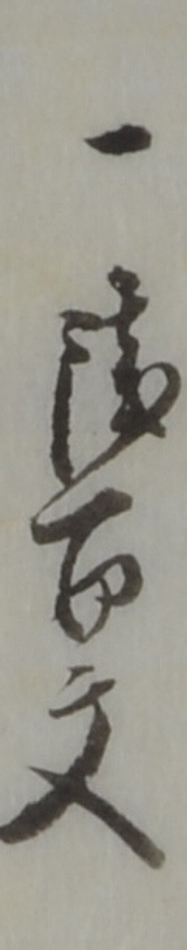一銭百文
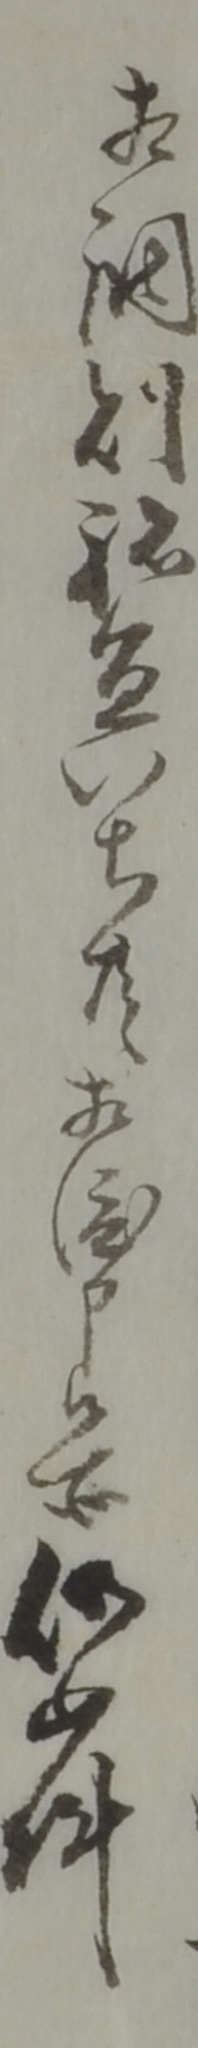相調則祢宜いち共相渡申候所仍如件
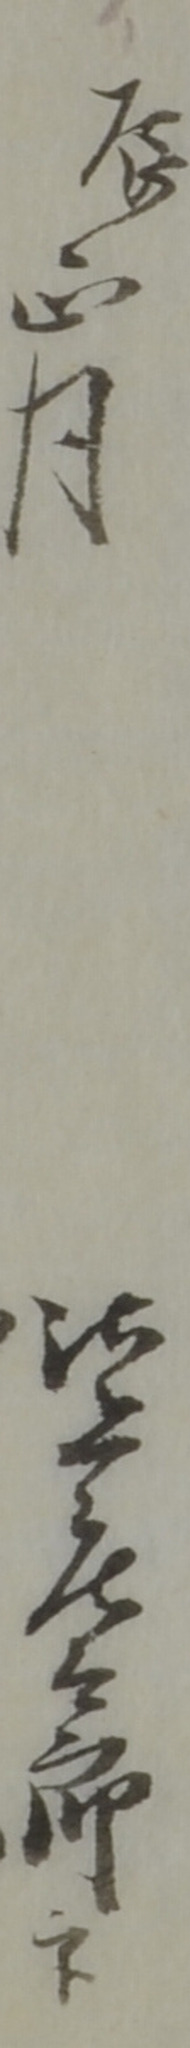辰正月池上庄太郎印
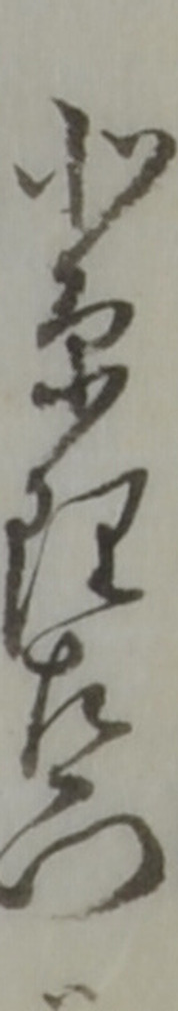北原理左衛門
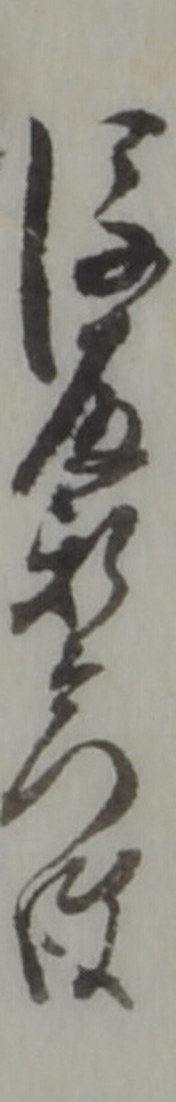後藤新右衛門様
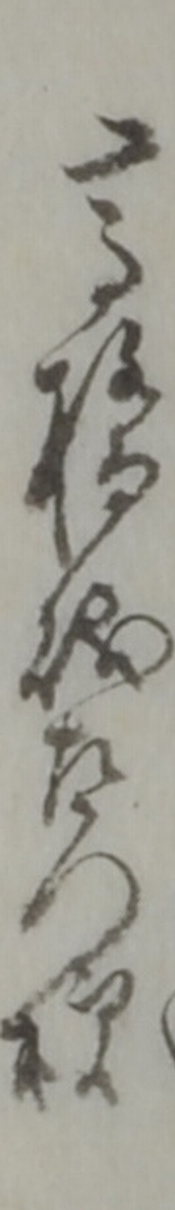高橋儀左衛門様

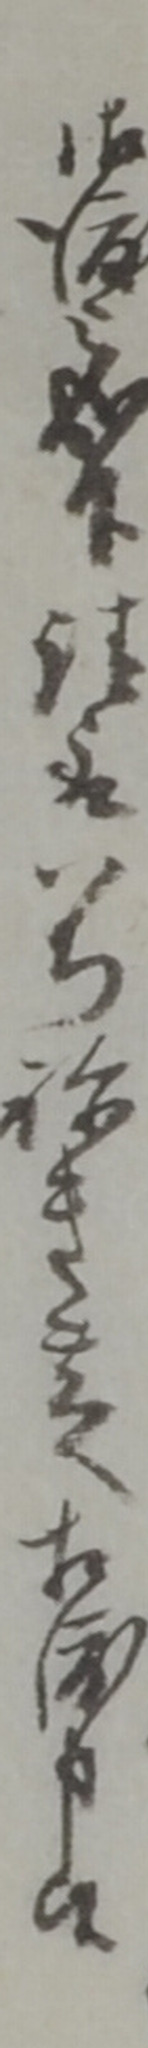御渡被成下請取若ねき共へ相済渡申候
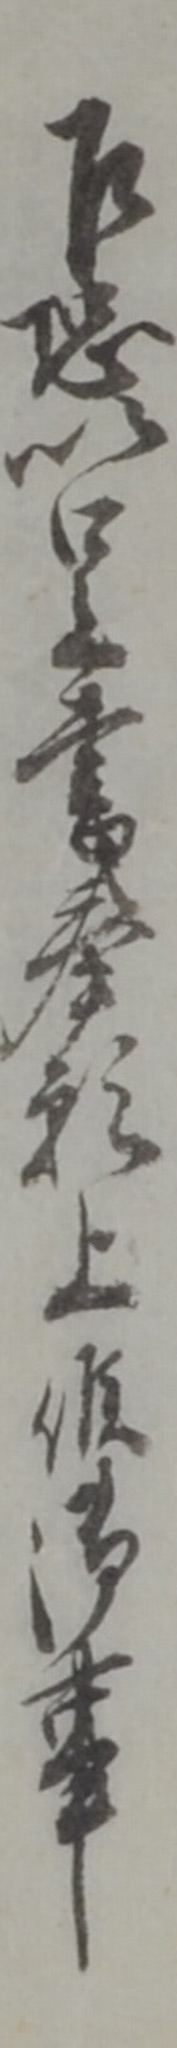乍恐以口上書奉願上候御事
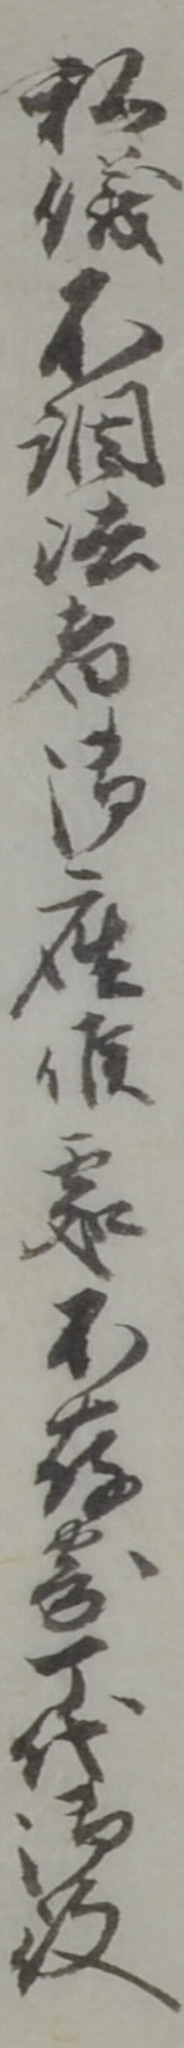私儀不調法者御座候處不存寄丁代御役
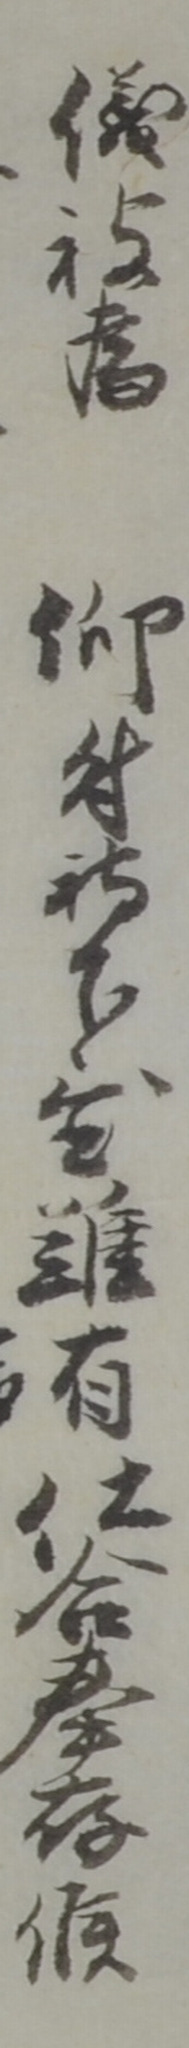儀被為仰付被下置難有仕合奉存候
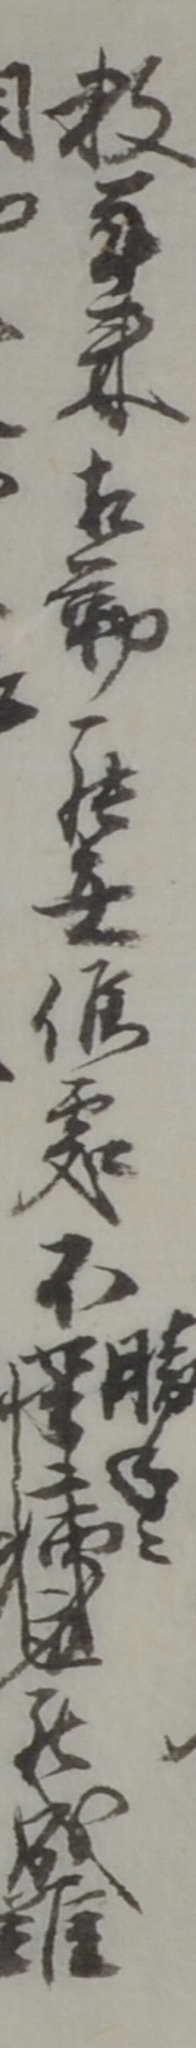数年来相勤罷在候處不勝手ニ罷成難
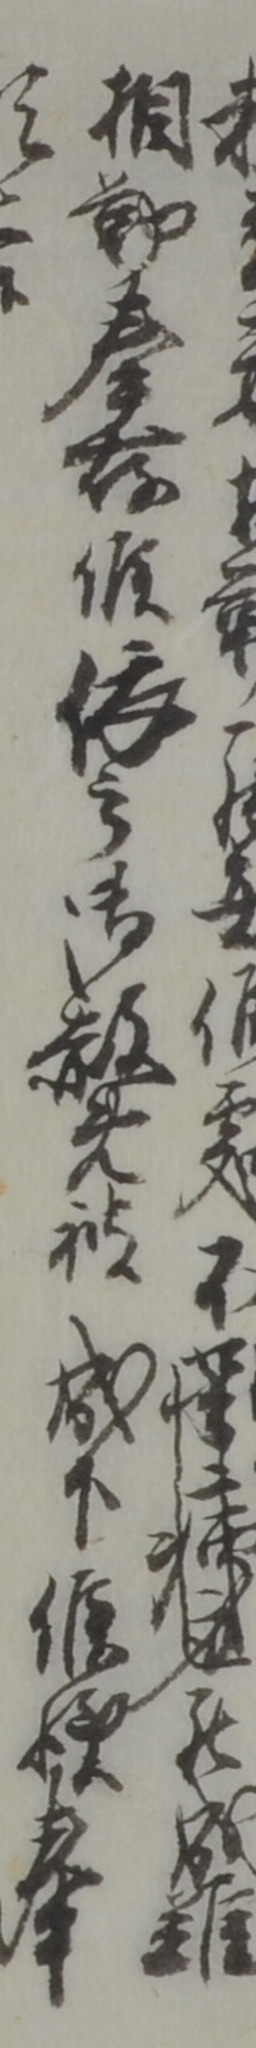相勤奉存候依之御赦免被成下候様奉
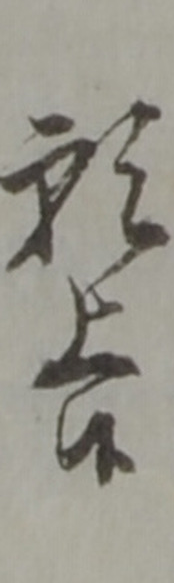願上候
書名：諸願書控簿
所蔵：伊那市立高遠町図書館・合同会社AMANE
